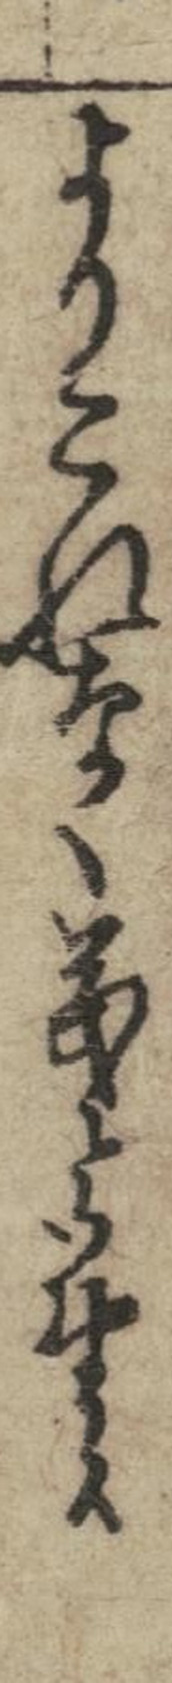よりこれなく義に御座候
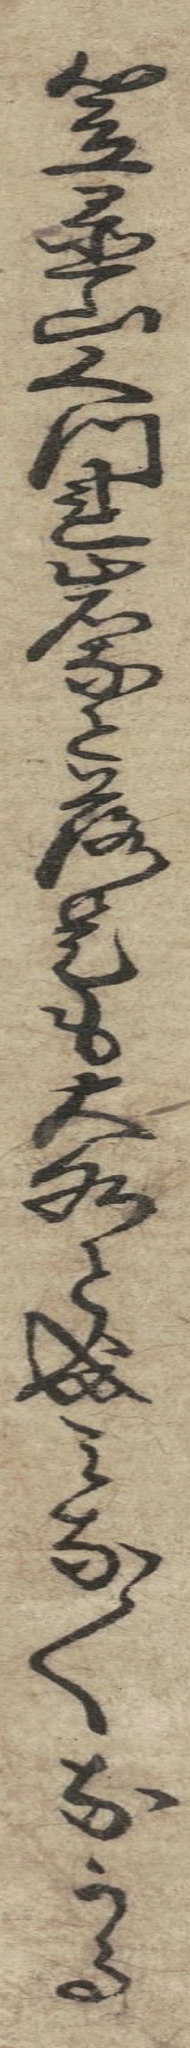笠置山くつれ岩なと落是も大水と成みな〳〵なかる
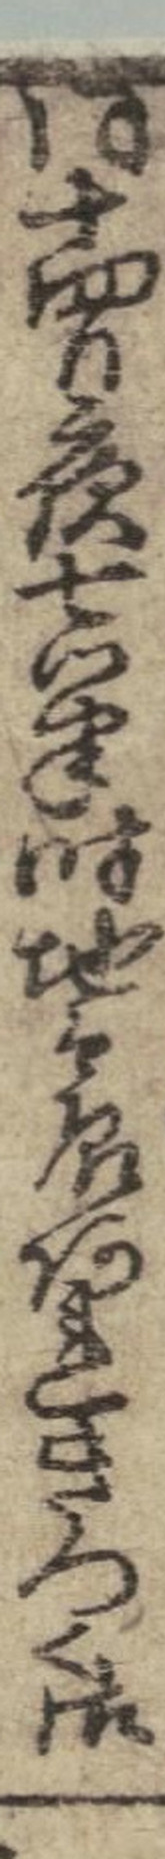同十四日夜七ツ半時地震あれきつく御
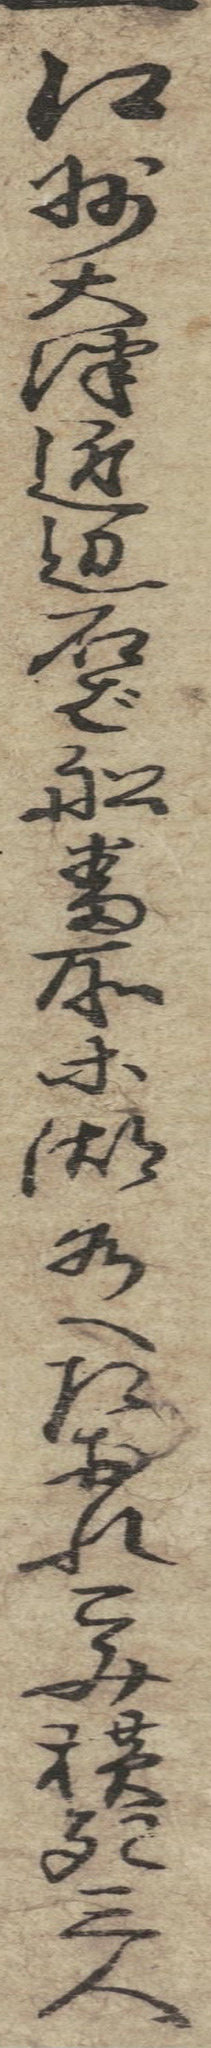一江州大津近辺石ば船番所等湖水へたおれこみ横死三人
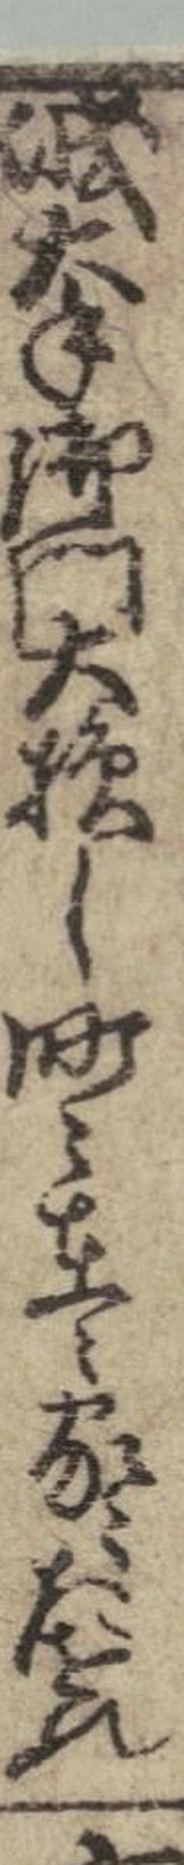城大手御門大損し町〻在〻家〻たをれ
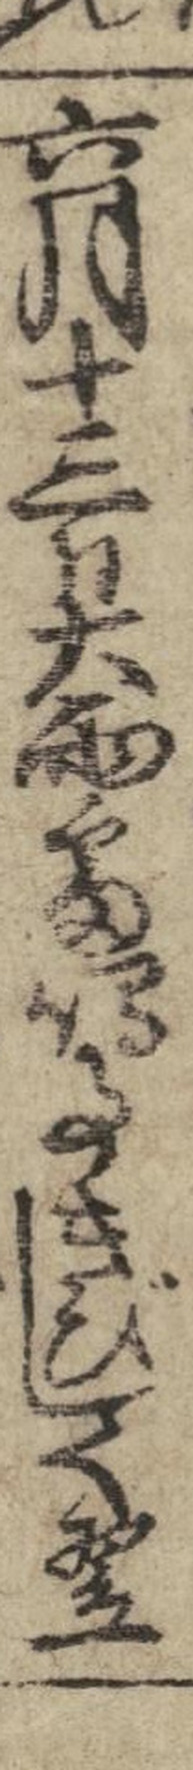六月十三日大雨雷鳴事きびしく翌
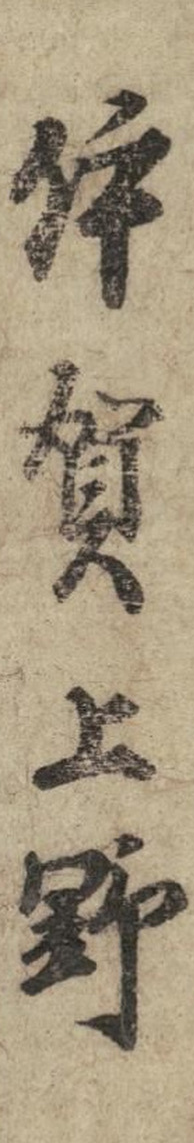伊賀上野
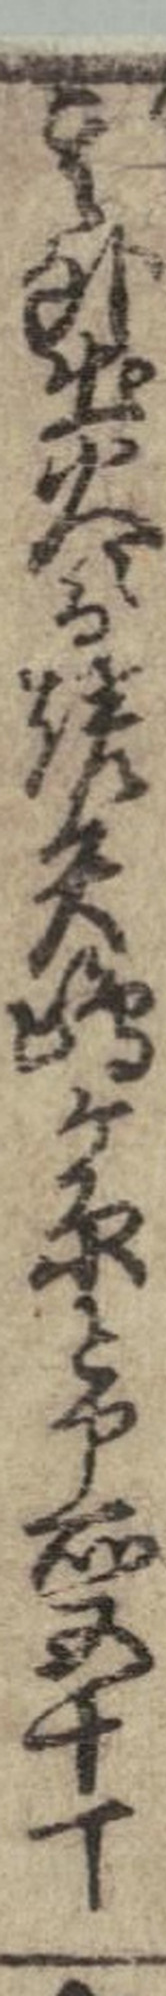其外出火にて焼失嶋ケ原と申処五十丁
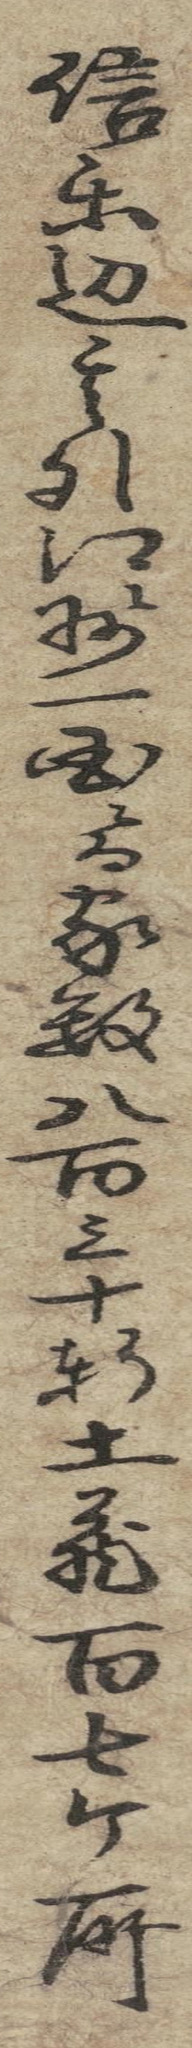信楽辺其外江州一国にて家数八百三十軒土蔵百七ケ所
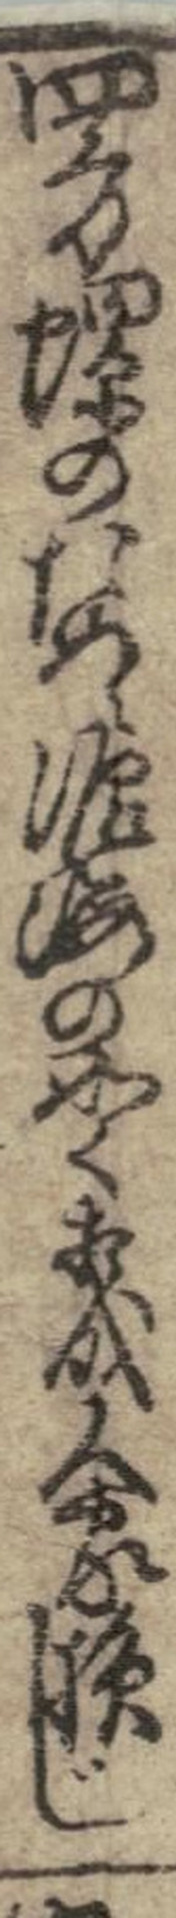四方螺のために泥海の如く相成人家損じ
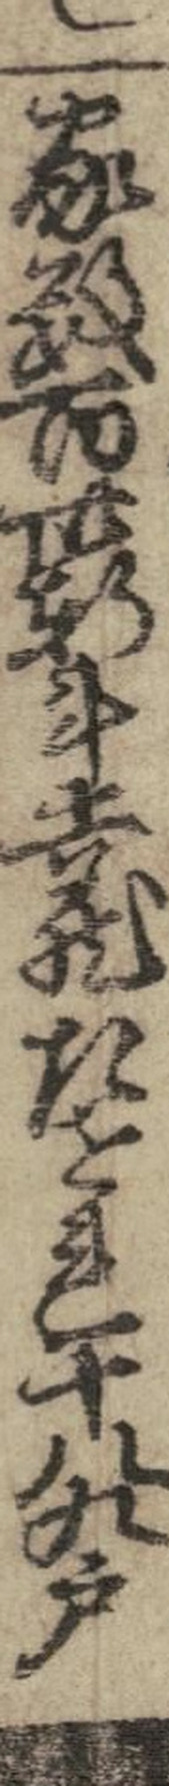家数百廿軒計土蔵たをれ十八九戸
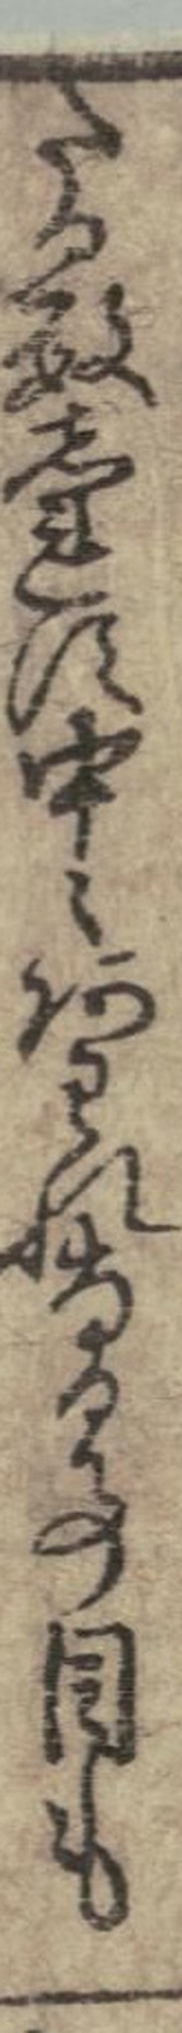たる数しれす中〻あわれなる事目も
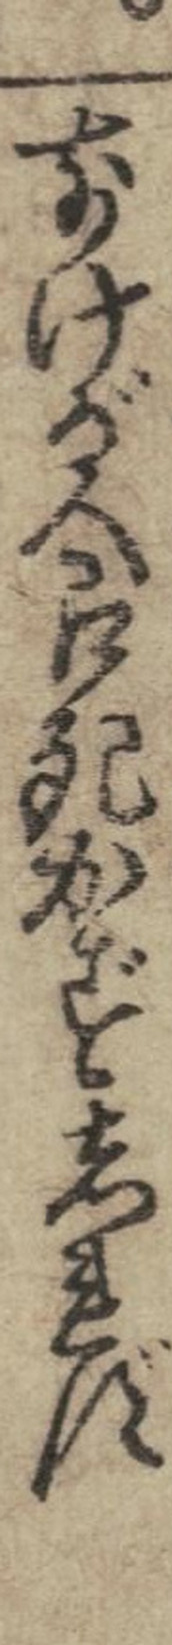前けが含死かずしれず
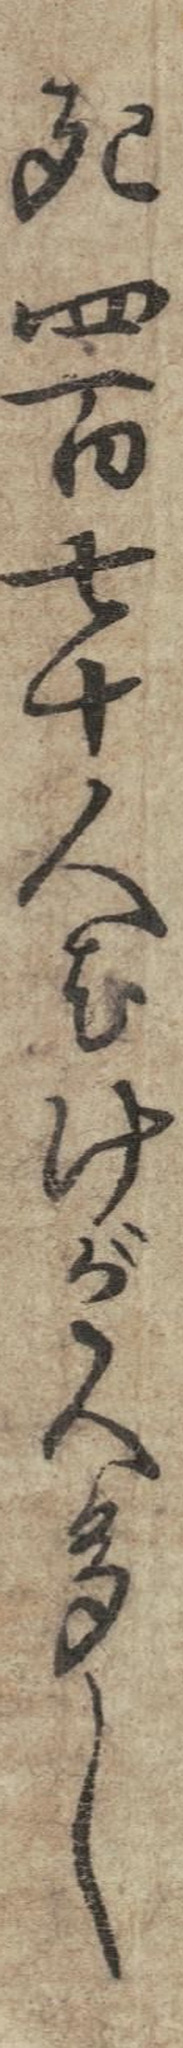死四百七十人至けが人多し
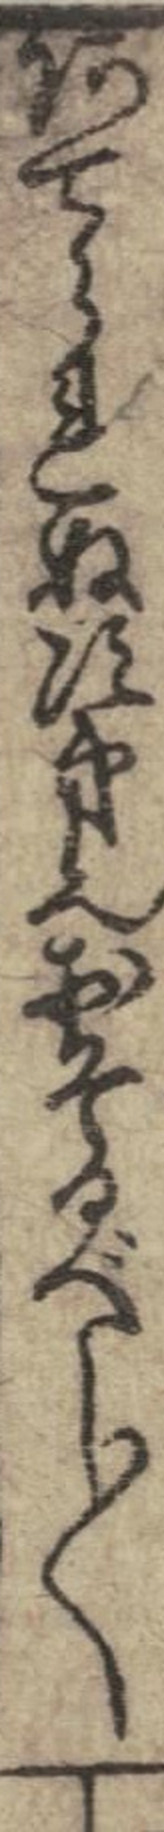あてられぬ次第也おそるべし〳〵
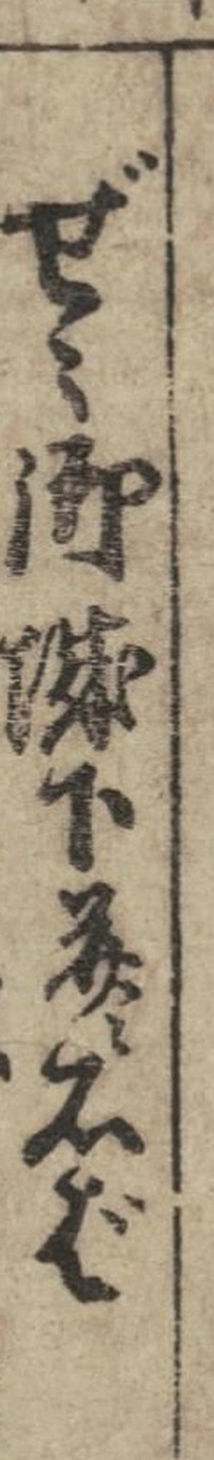ぜ〻御城下幷ニ石ば
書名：聞書　諸國大地震并ニ出火・早飛脚廻りにてくわしき所本しらべ　大地震・山城勢州大和三河江州越前　聞書　大地震並ニ出火の次第
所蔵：東京大学地震研究所図書室 Earthquake Research Institute Library, The University of Tokyo, JAPAN
